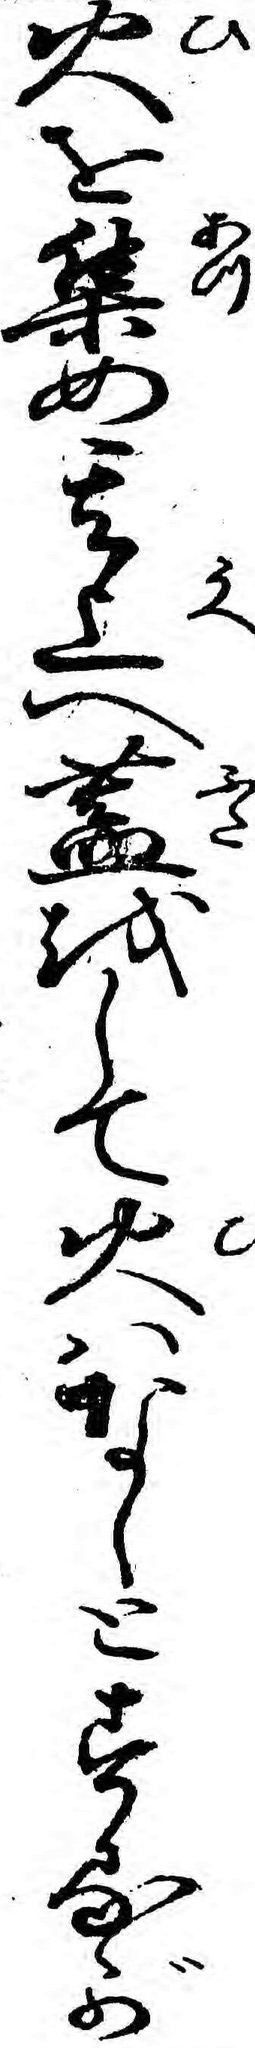火を集め其上へ蓋をして火はなしとするが
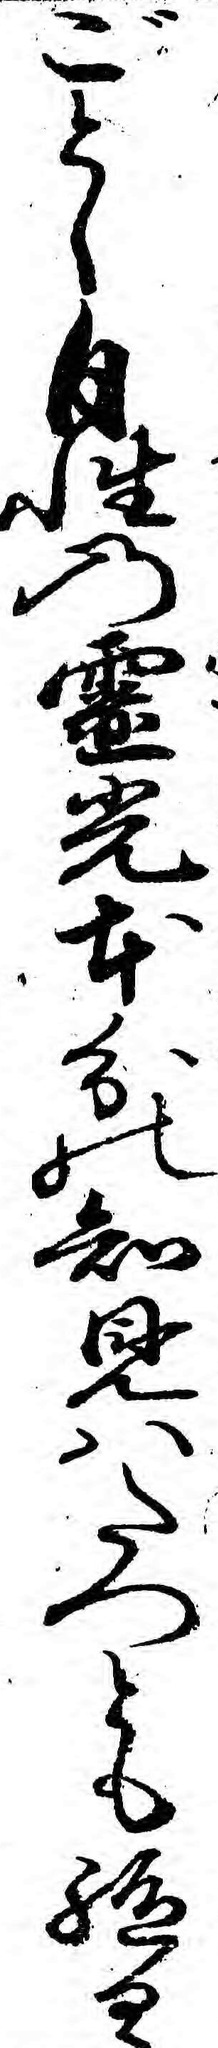ごとし自性の霊光本分の知見はたつとも絶るゝ
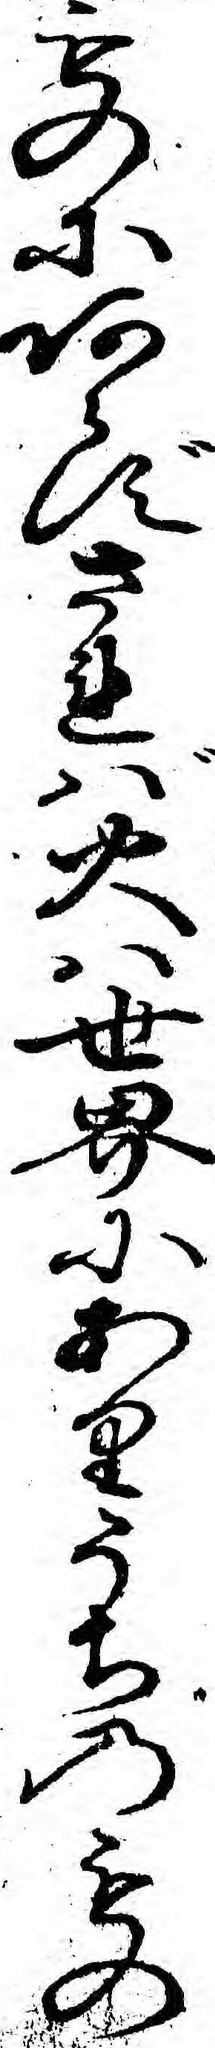ものにあらずされば火は世界にありうちのもの

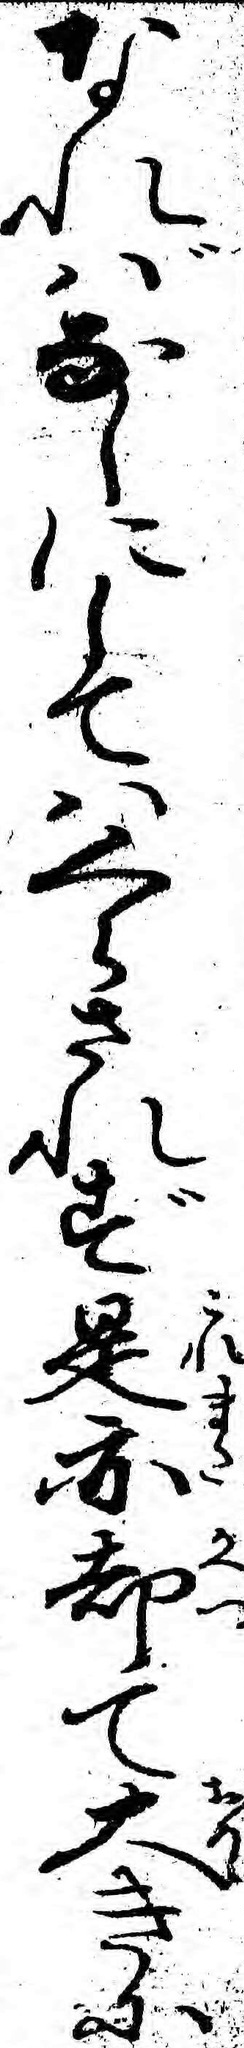なればなしにしてはしらされず是亦却て大きに
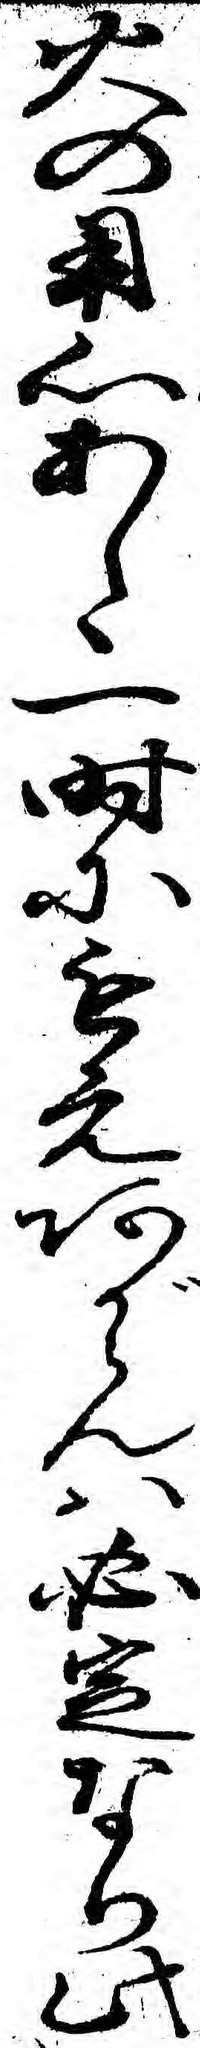火の用心あしゝ一時にもえあがらんは必定なり此
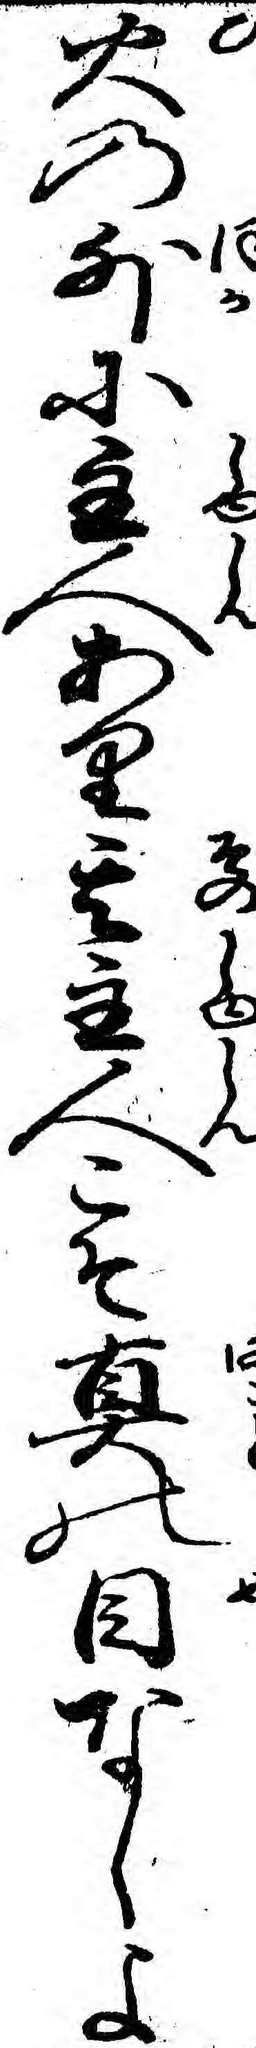火の外に主人あり其主人こそ真の目なしよ
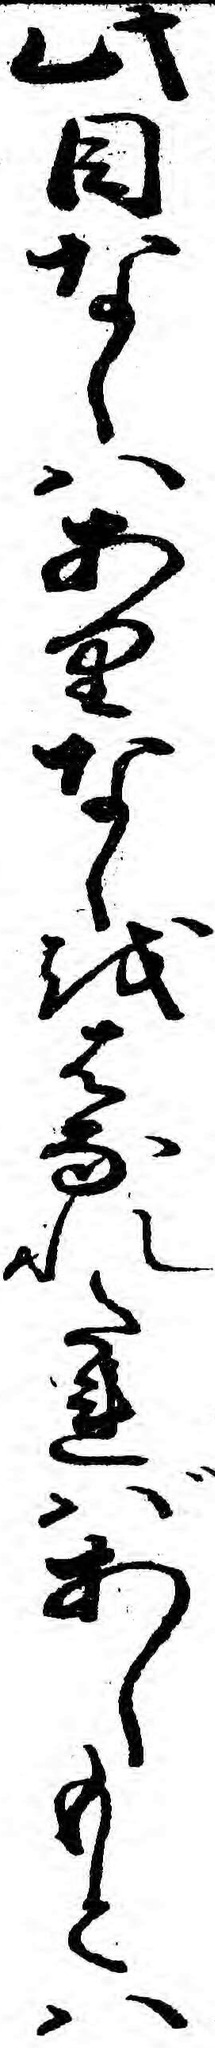此目なしはありなしをはなれたればあしもとは
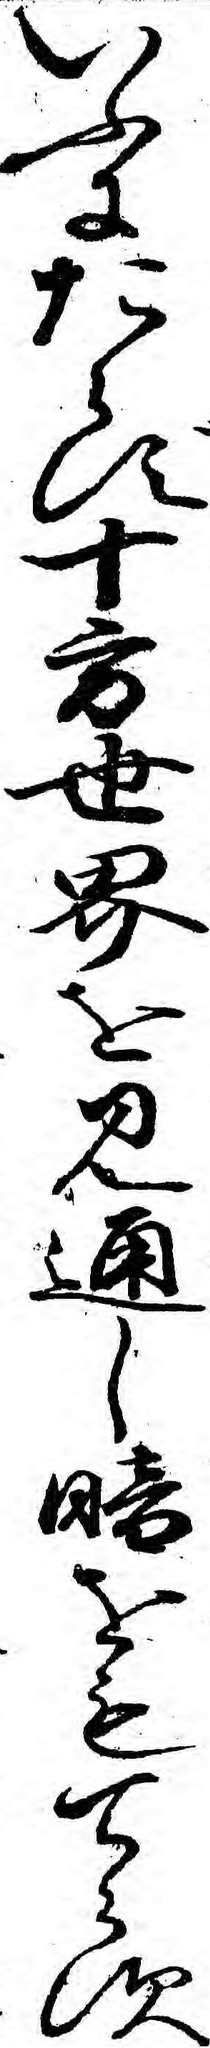いふにたらず十方世界を見通し暗をもてらす
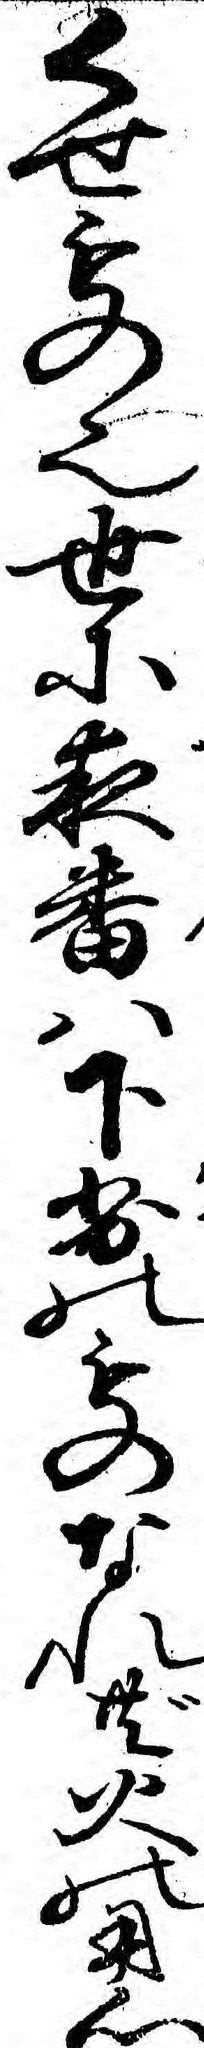くせもの也世に夜番は下劣のものなれば火の用心
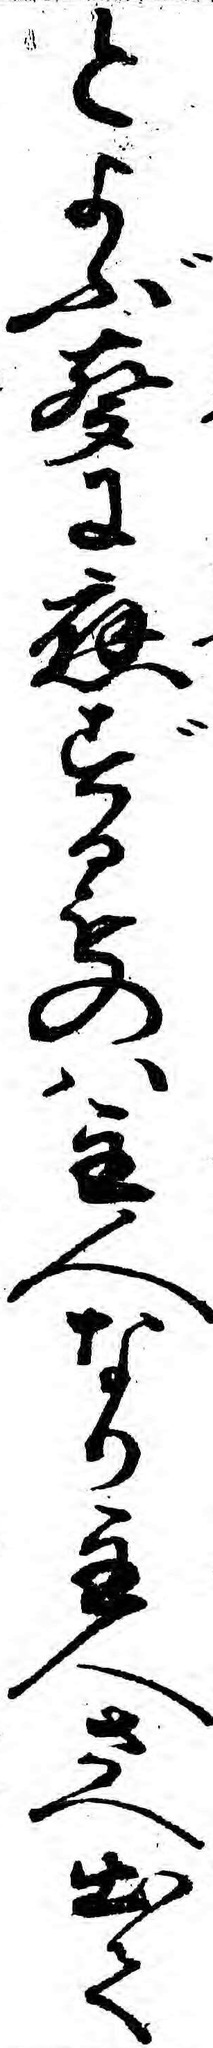とよぶ声に応ずるものは主人なり主人さへ出て
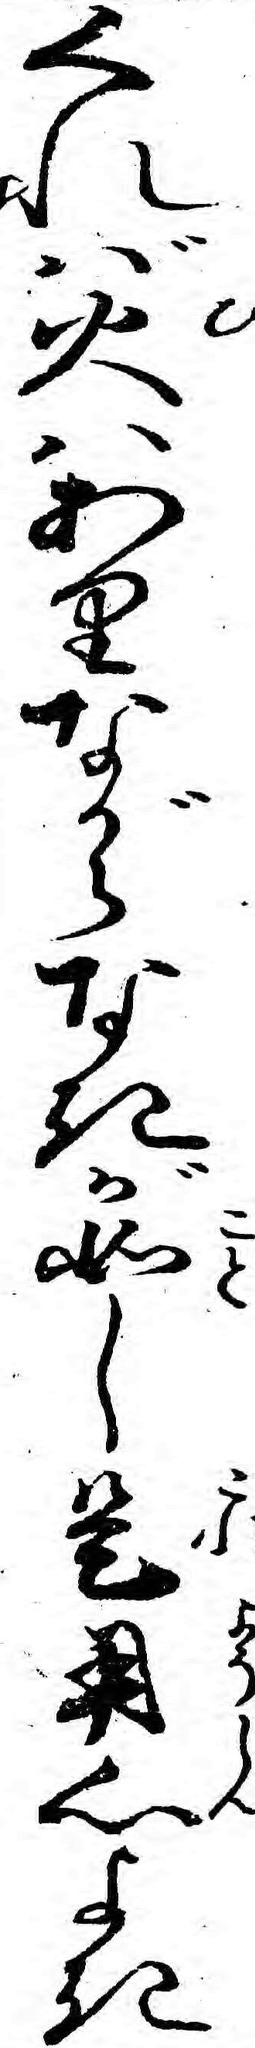くれば火はありながらなきが如し是用心よき
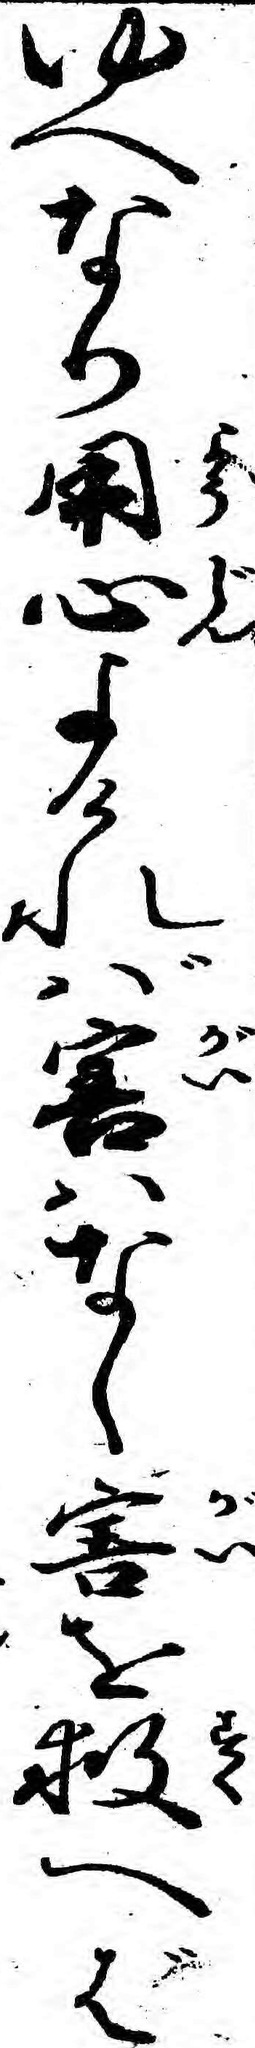ゆへなり用心よければ害はなし害を救へば
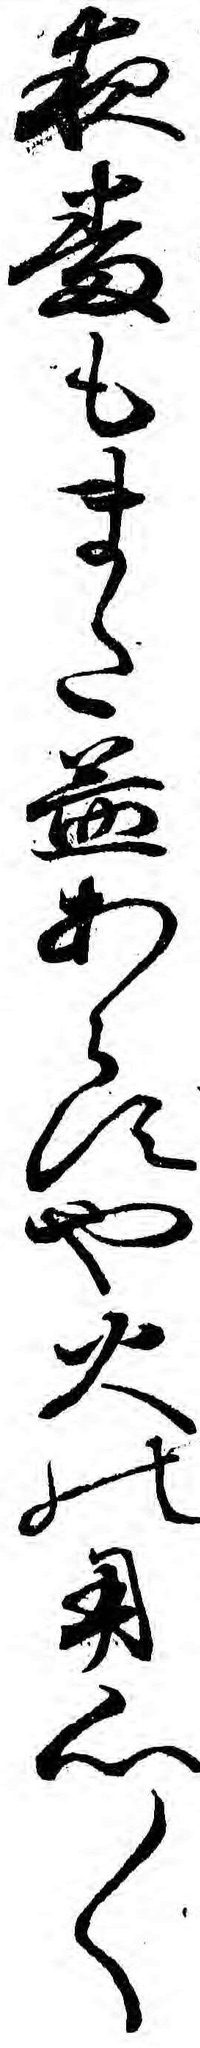夜番もまた益あらずや火の用心〳〵
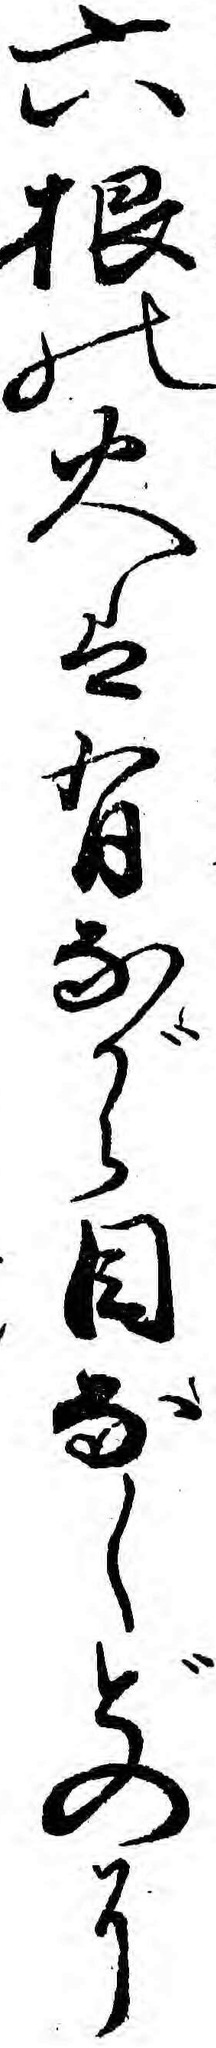六根の火は有ながら目なしどのに
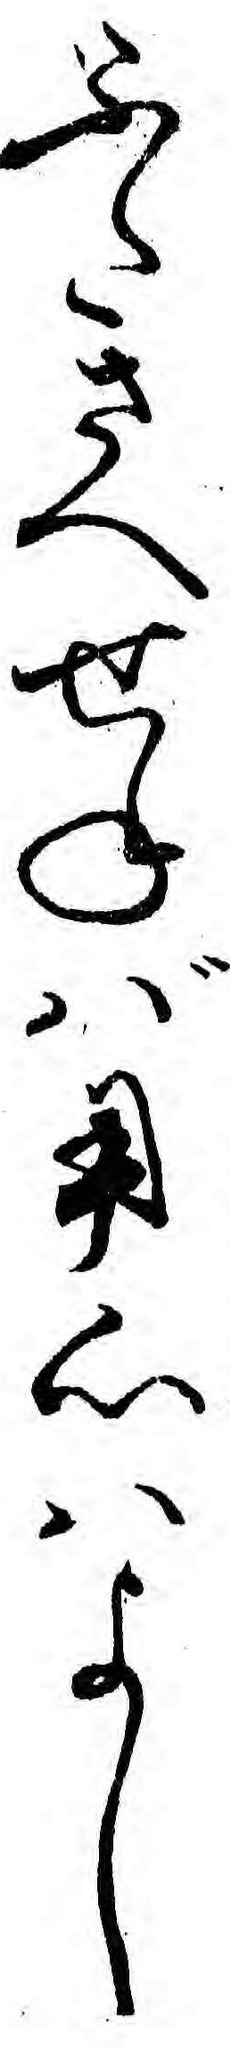ふたさへせねば用心はよし
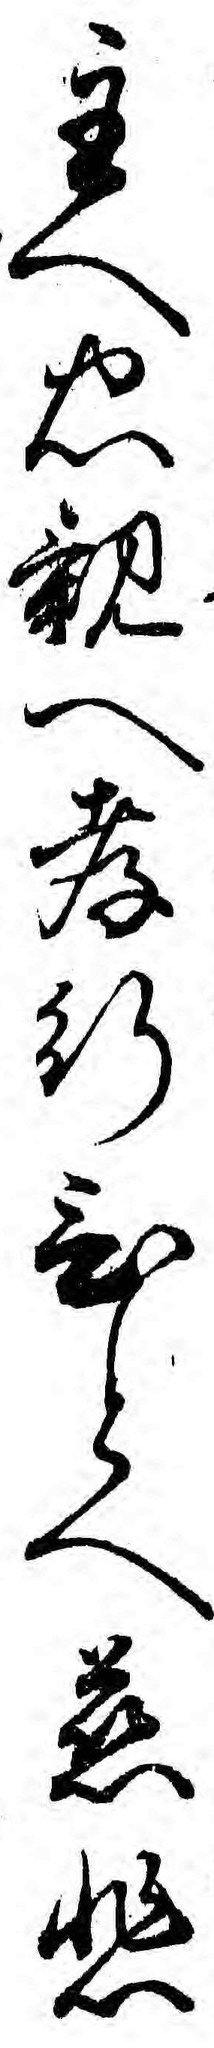主へ忠親へ孝行ひとへ慈悲
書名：目なし用心抄
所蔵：国文学研究資料館
